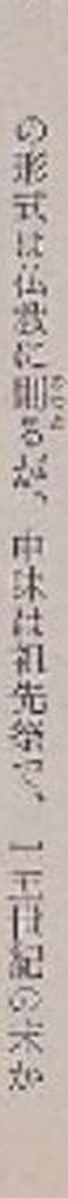の形式は仏教に則るが、中味は祖先祭で、一五世紀の末か
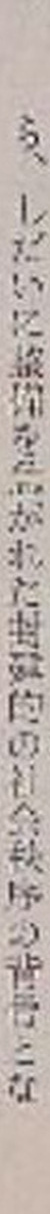ら、しだいにをがれた封建的の社会秩序の背骨とな
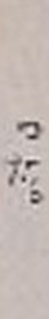った。
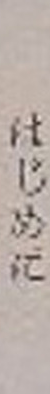はじめに
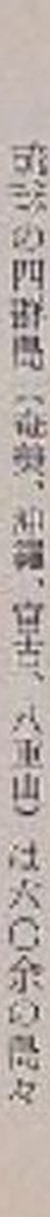琉球の四群島(奄美、沖縄、宮古、八重山)は六〇余の島々
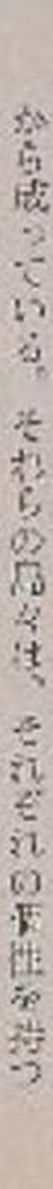から成っている。それらの島々は、それぞれの性を持つ
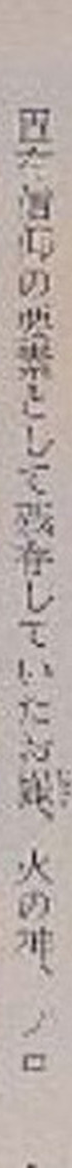固有信仰の要素として残存していたお嶽、火の神、ノロ
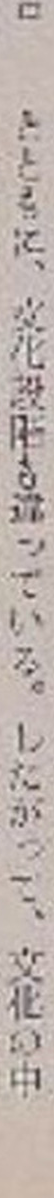とともに、文化段階も違っている。したがって、文化の中
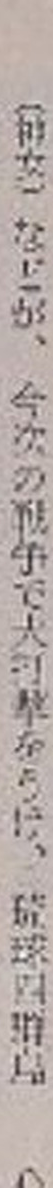(神女)などが、今次の戦争で大打撃をうけ、琉球四群島
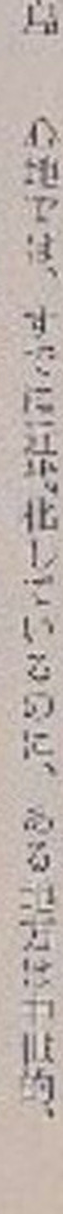心地では、すでに近代化しているのに、ある地方は中世的、
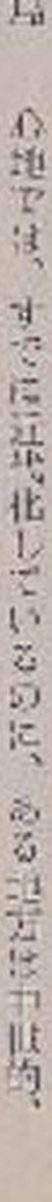心地では、すでに近代化しているのに、ある地方は中世的、
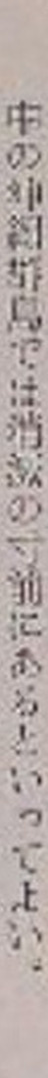中の沖縄群島では消滅の寸前にあるといってよい。
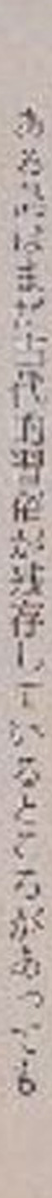ある島はまだ古代的習俗が残存しているところがあっても
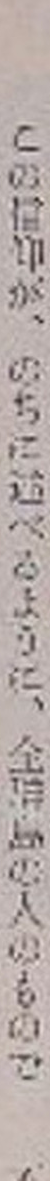この信仰が、のちに述べるように、全群島の人のもので
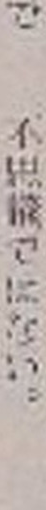不思議ではない。
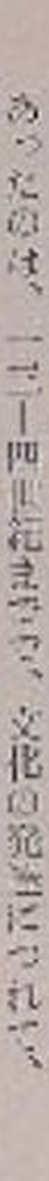あったのは、一三―四世紀までで、文化の発達につれて、
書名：沖縄固有信仰のおとろえ
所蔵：University of the Ryukyus Library
